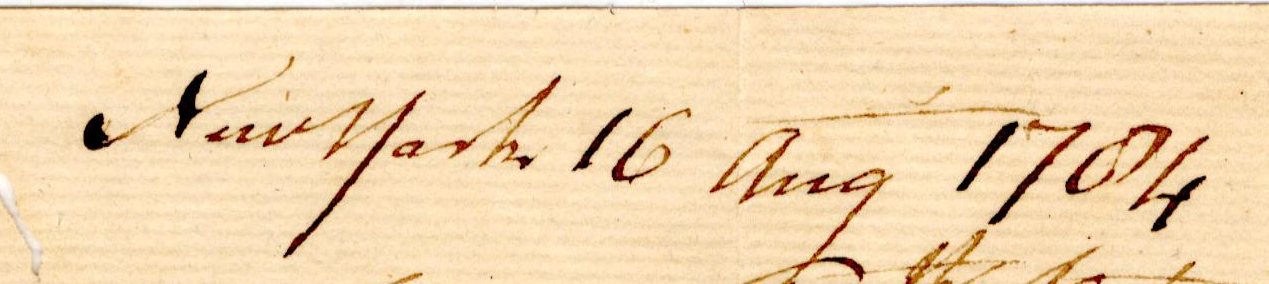New York 16 Aug^t 1784
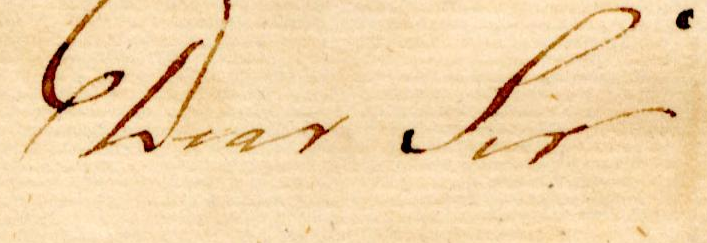Dear Sir
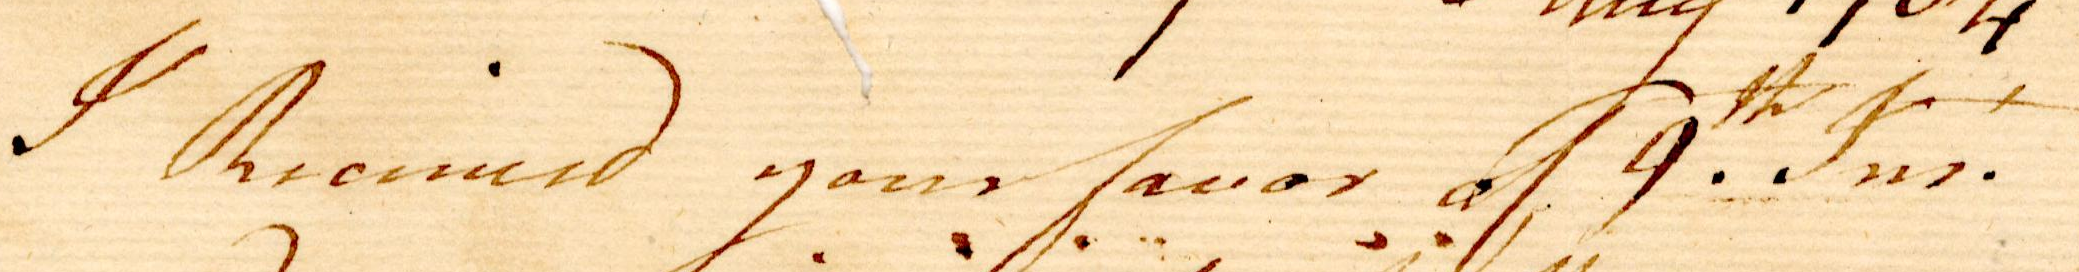I Received, your favor of 9^th Ins^t.
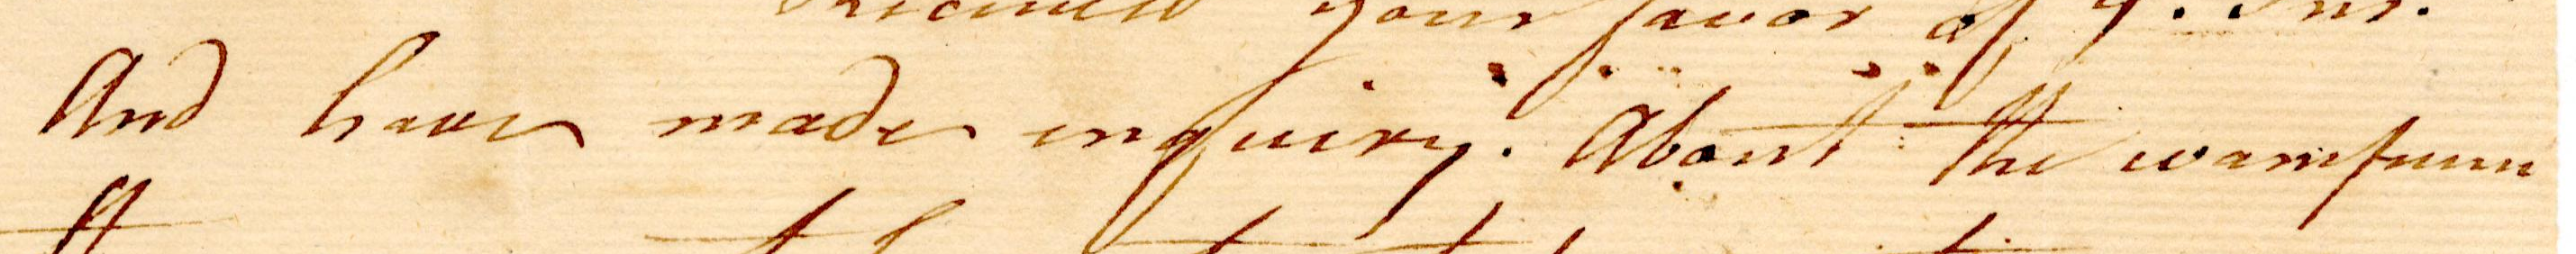and have made inquiry. about the wampum
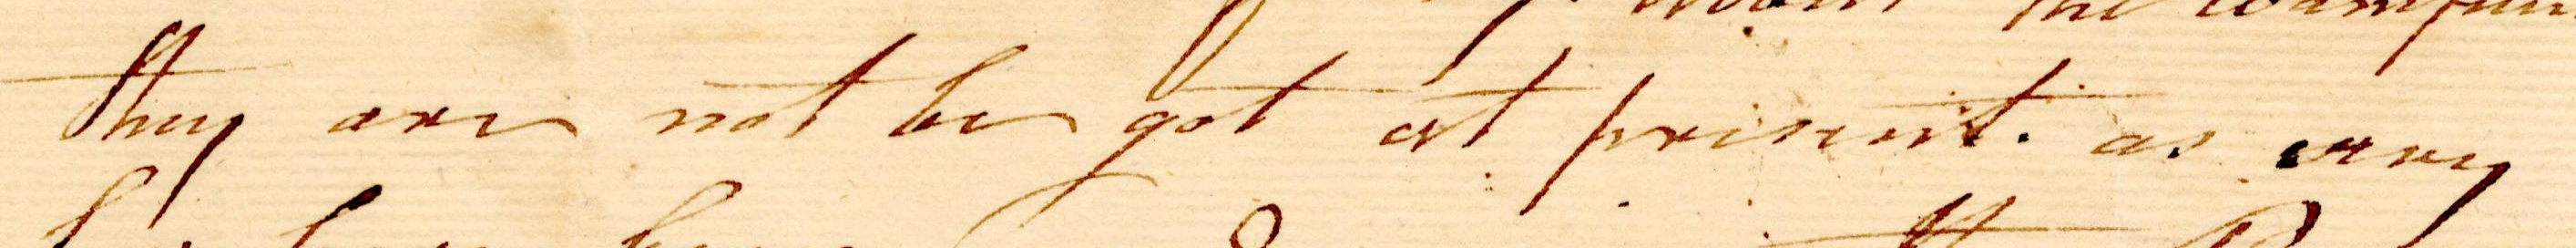they are not be got at present as very
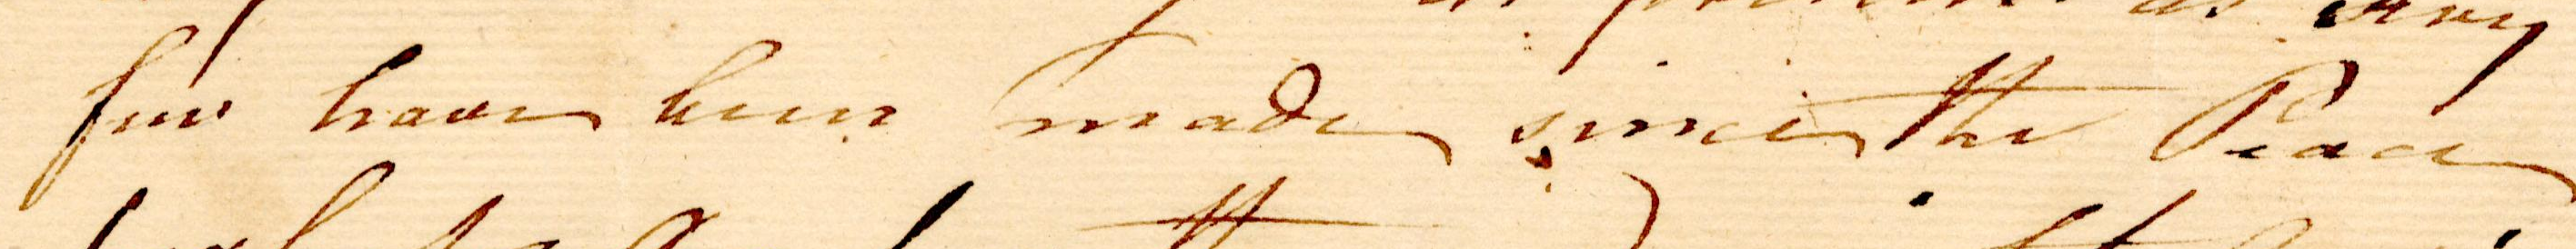few have been made since the Peace
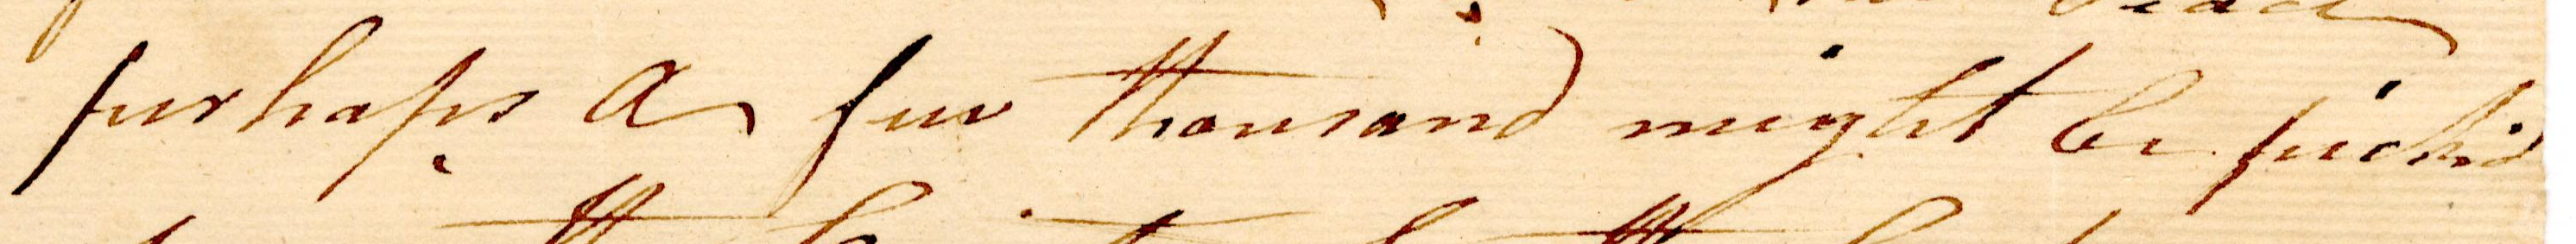perhaps a few thousand might be pick'd
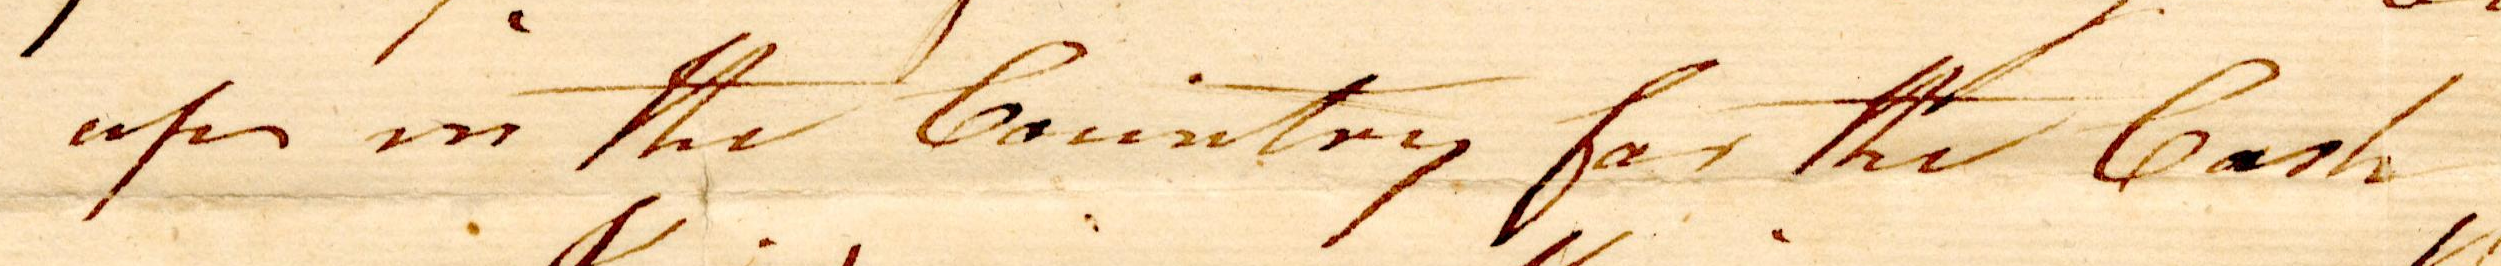up in the country for the Cash
